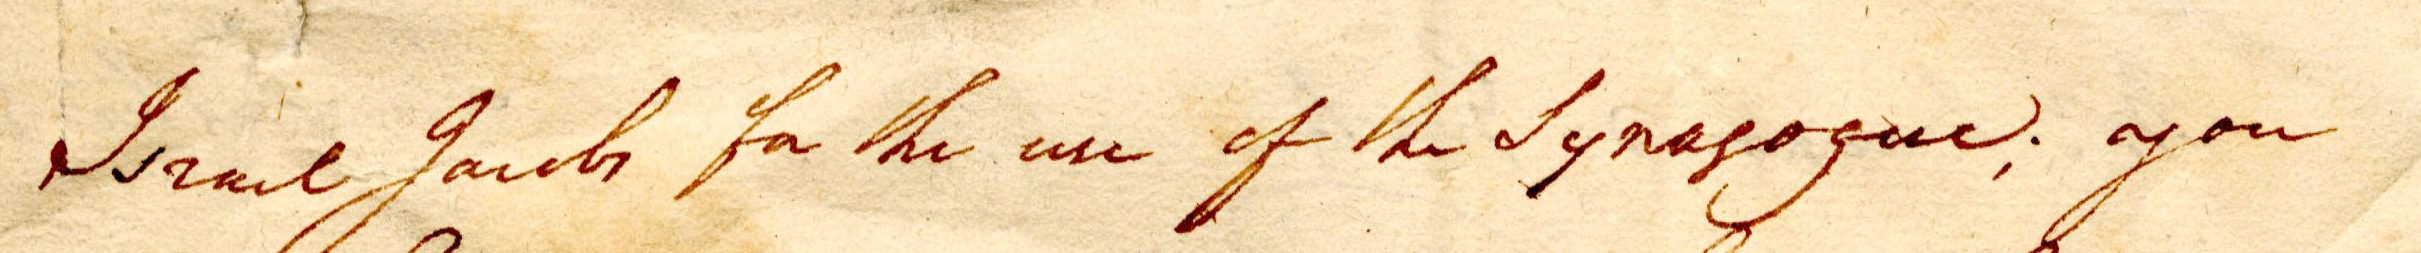Israel Jacobs for the use of the Synagogue; you
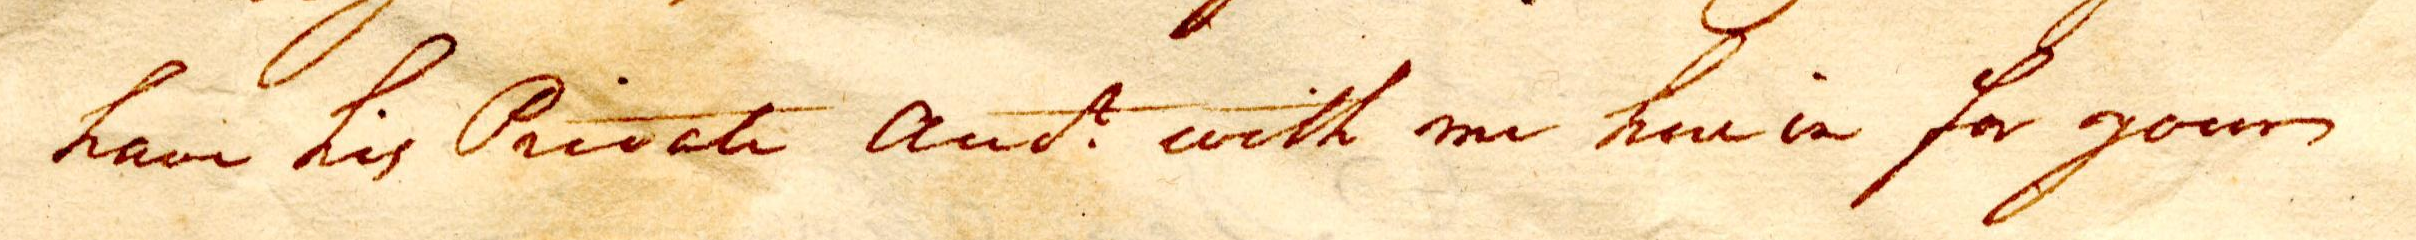have his Private Acco^t. with me here in for your
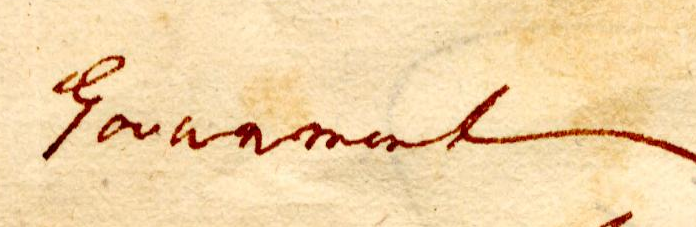Government
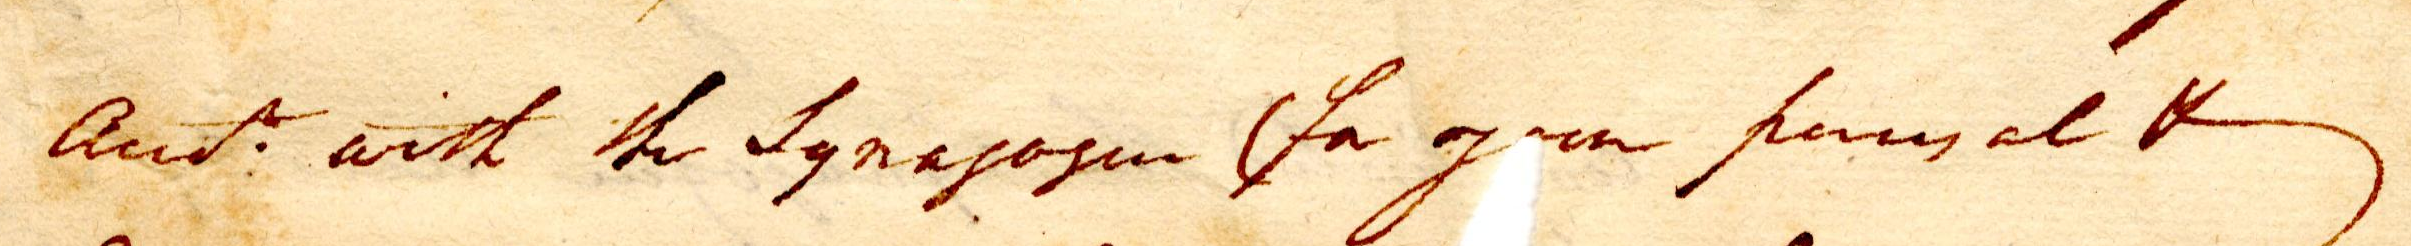Acco^t. with the Synagogue (For your personal &
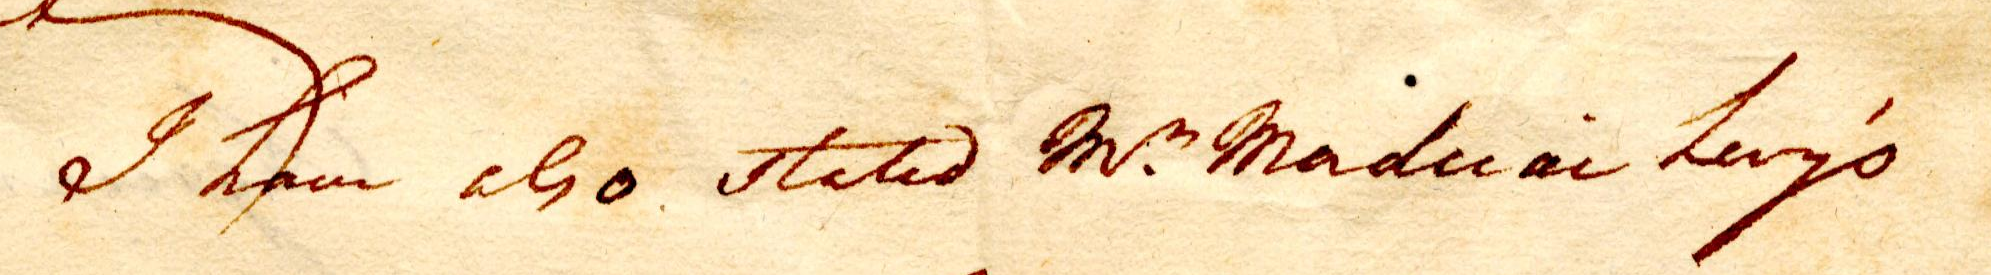I have also stated M^r. Mordecai Levy's
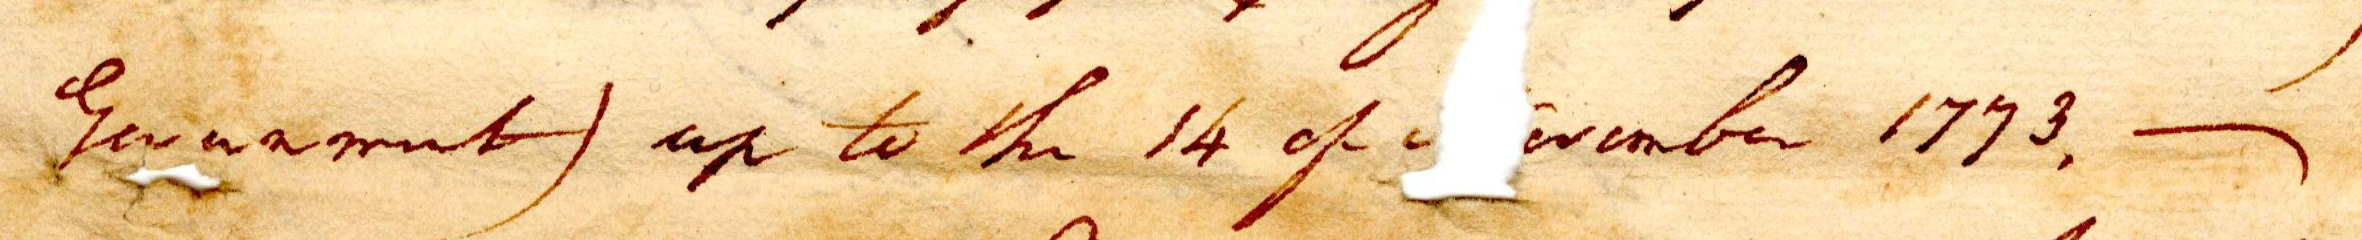Government) up to the 14 of November 1773.-
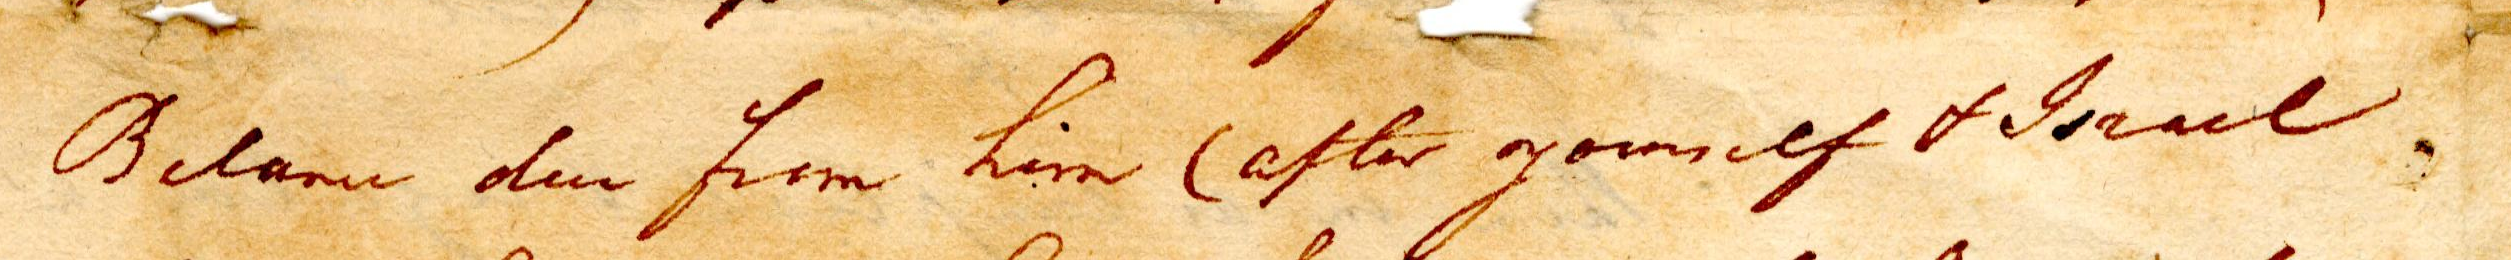Belance due from him (after yourself & Israel.
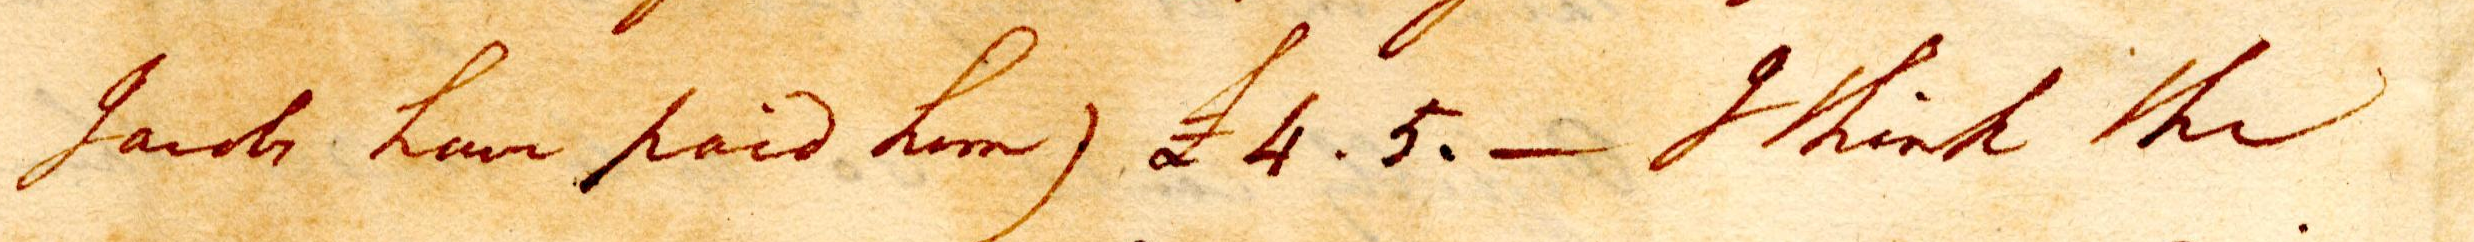Jacobs have paid him) £4.5.- I think the
